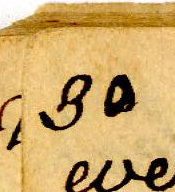30
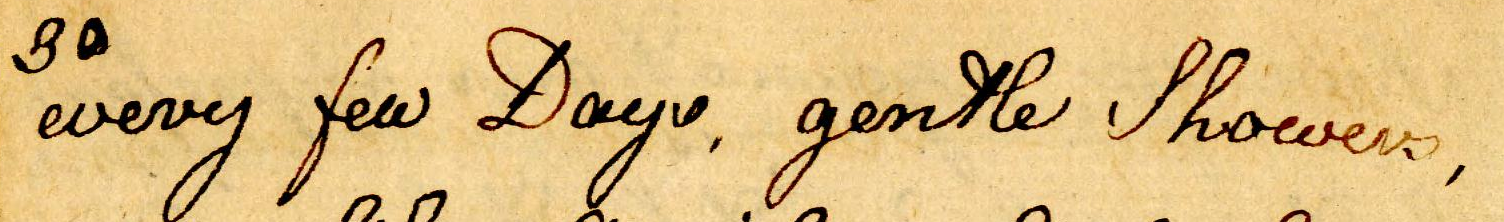every few Days, gentle Showers,
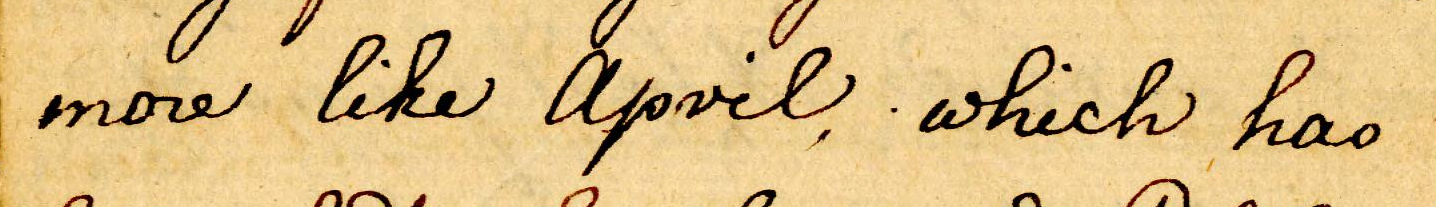more like April, which has
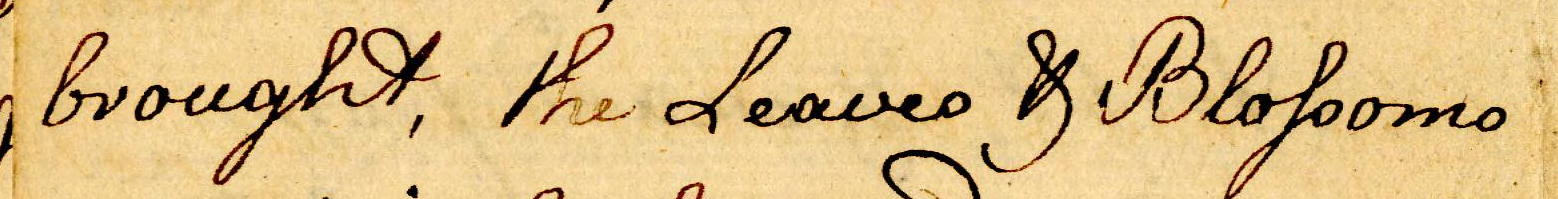brought, the Leaves & Blossoms
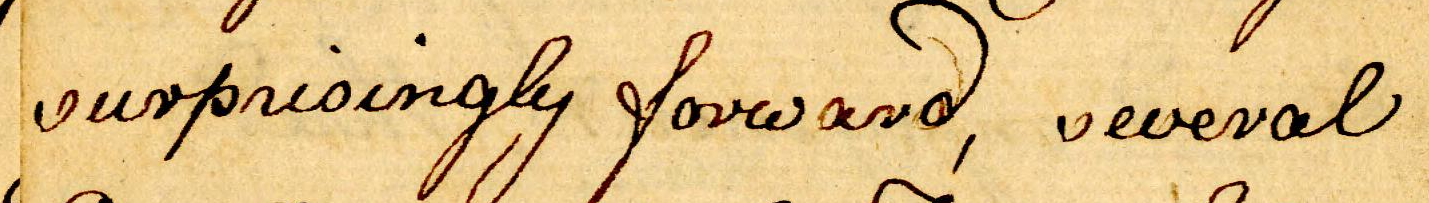surprisingly forward, several
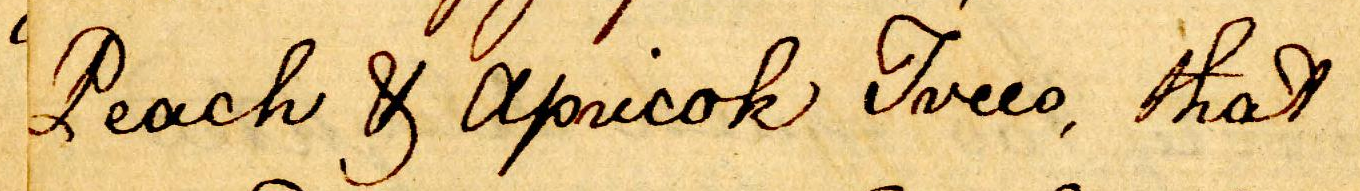Peach & Apricok Trees, that
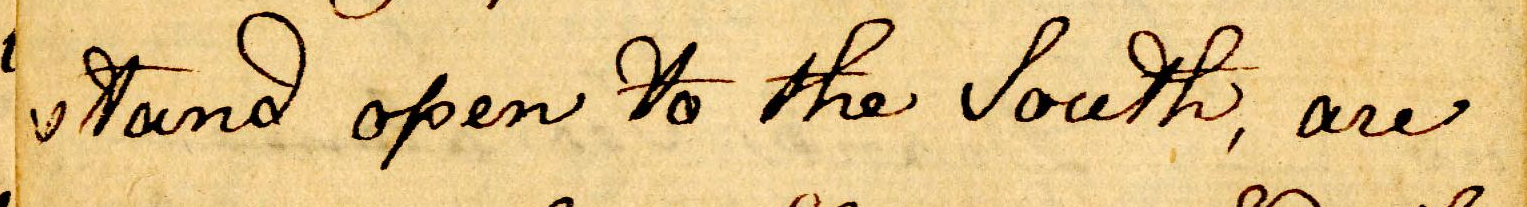stand open to the South, are
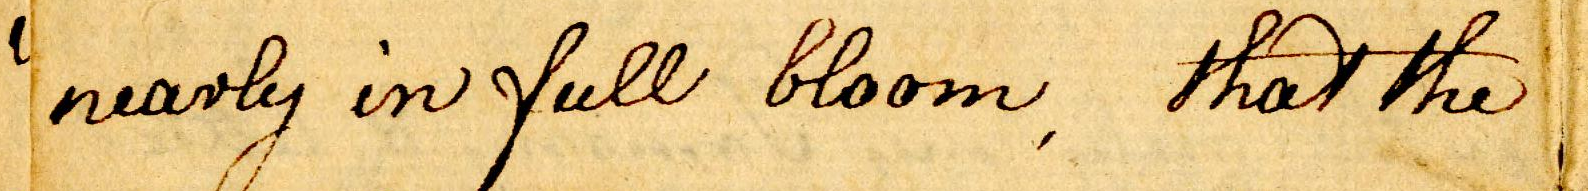nearly in full bloom, that the
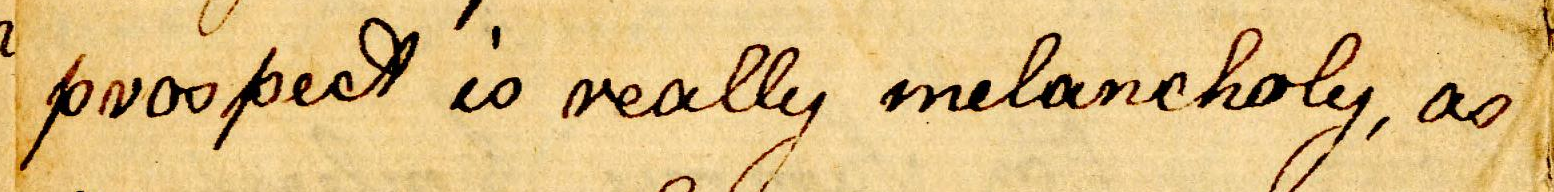prospect is really melancholy, as
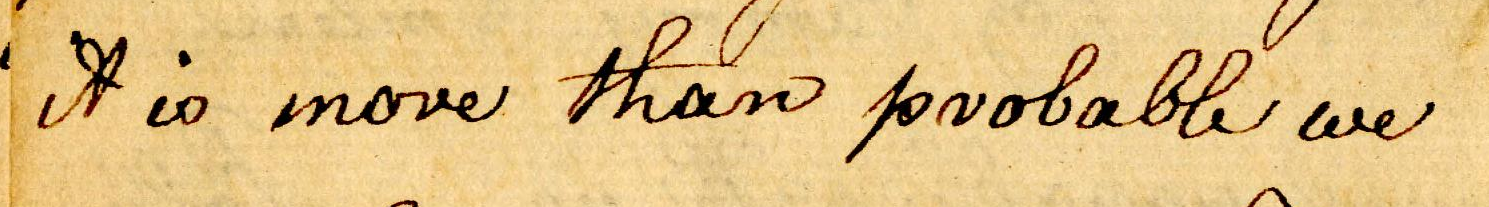it is more than probable we
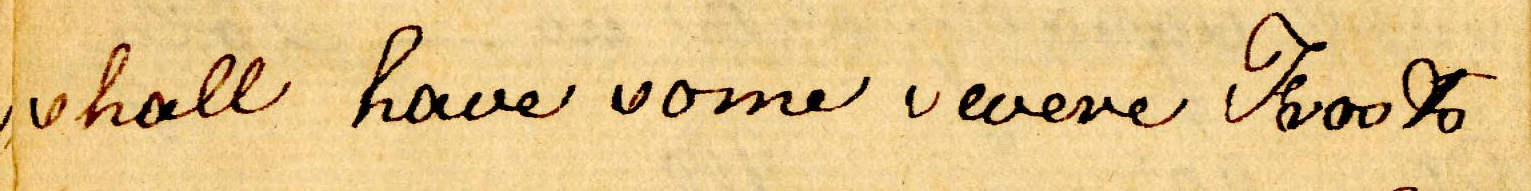shall have some severe Frosts
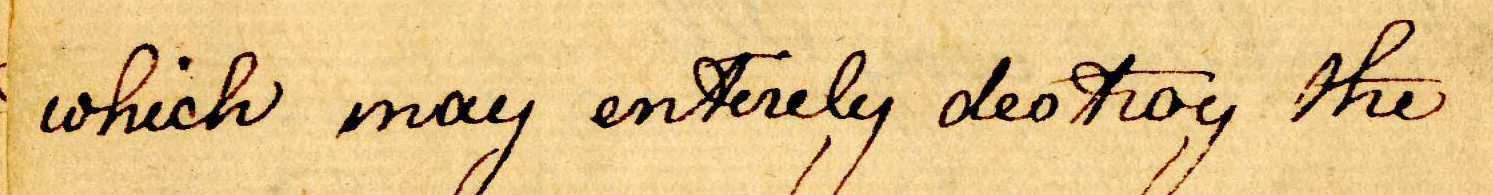which may entirely destroy the
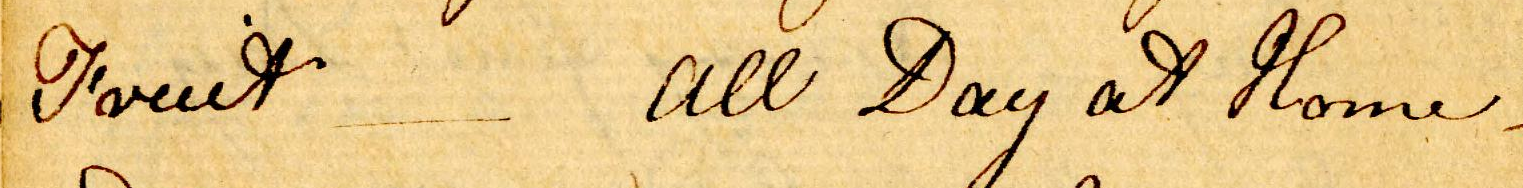Fruit- All Day at Home
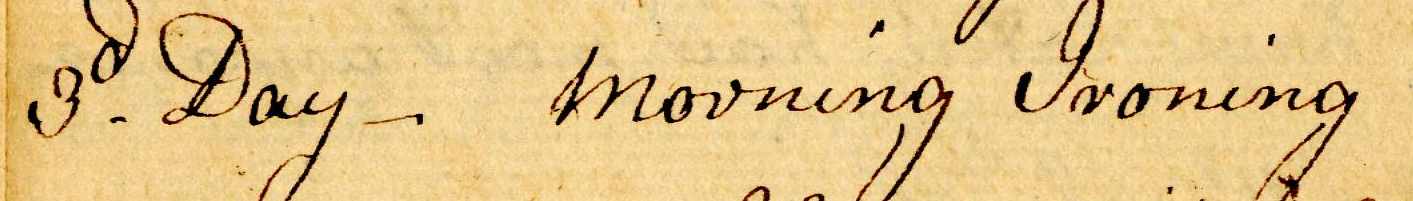3^d Day- Morning Ironing
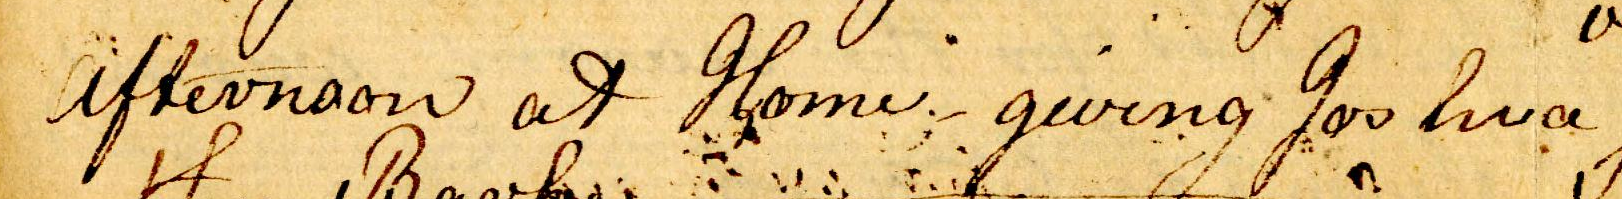Afternoon at Home giving Joshua
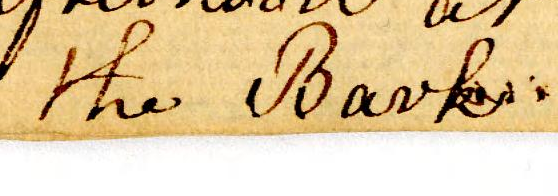the Bark
